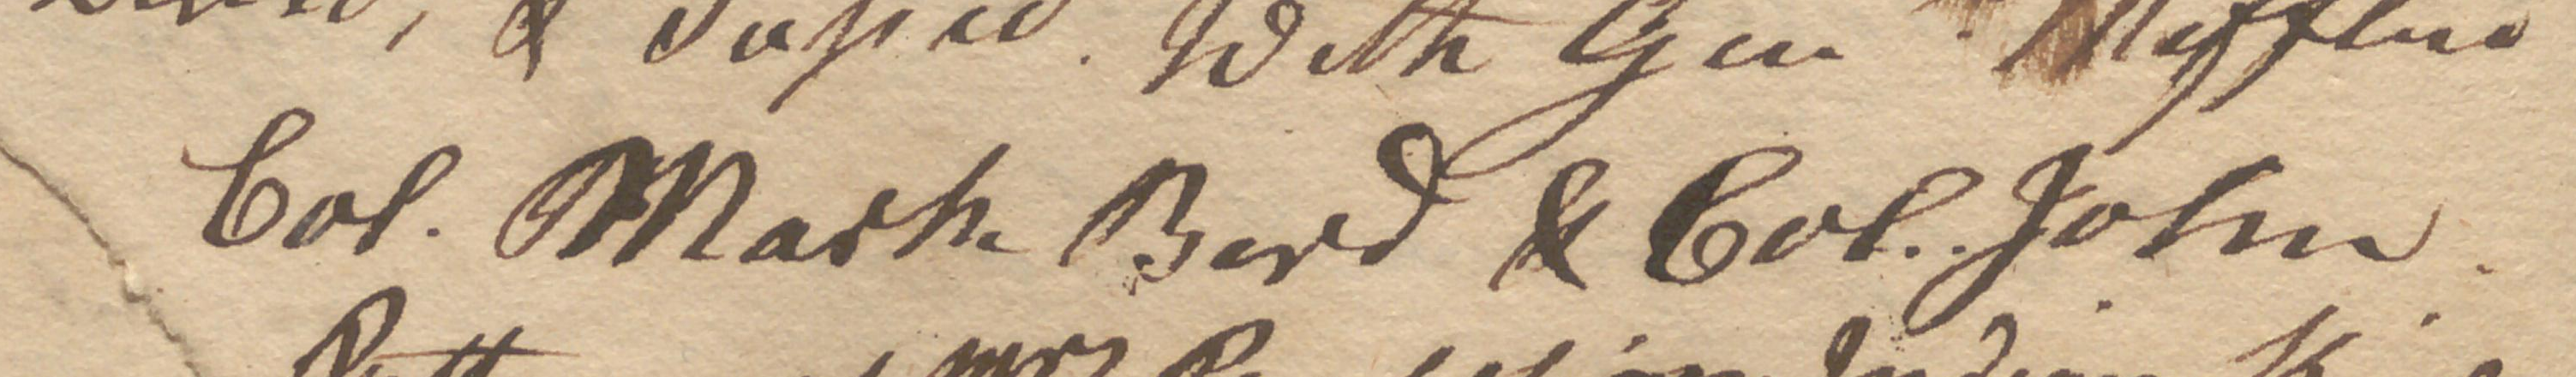Col. Mark Bird & Col. John
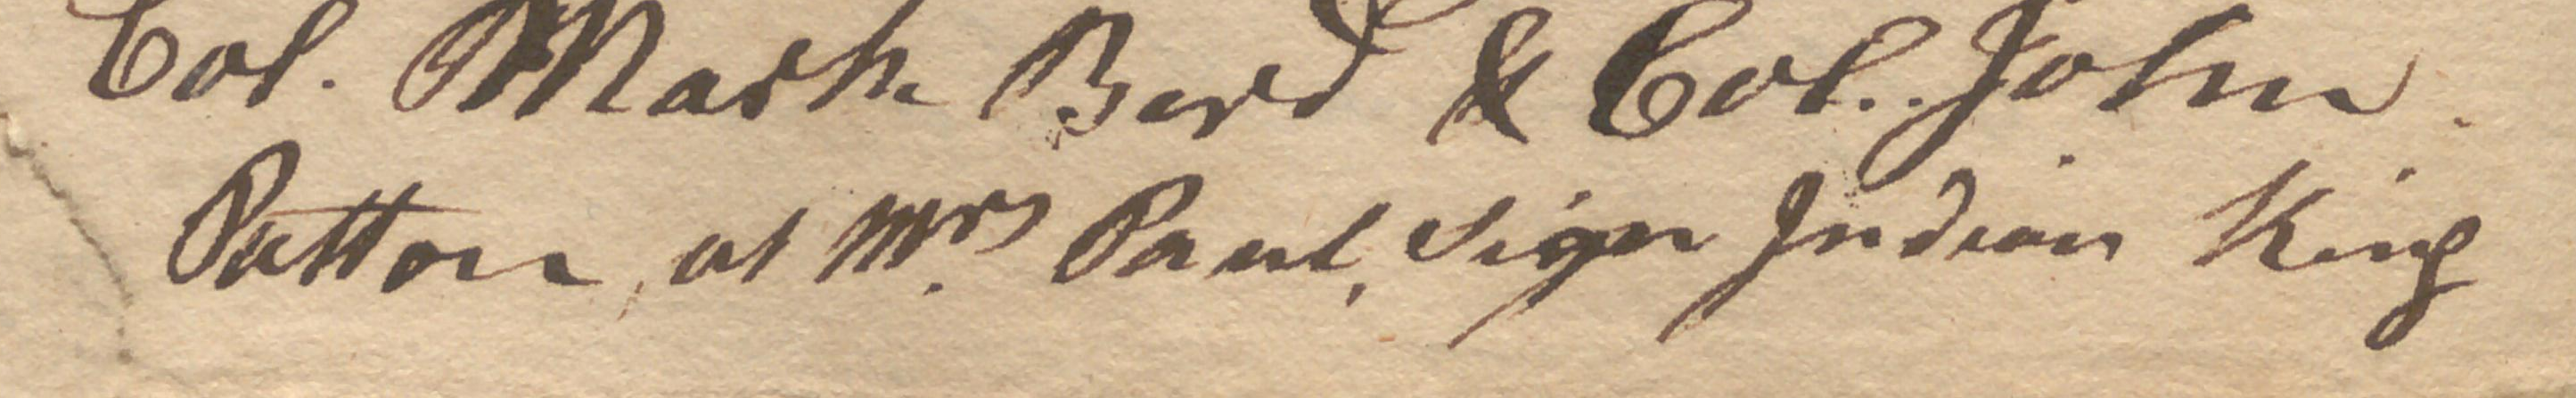Patton at M^rs. Paul Sign Indian King
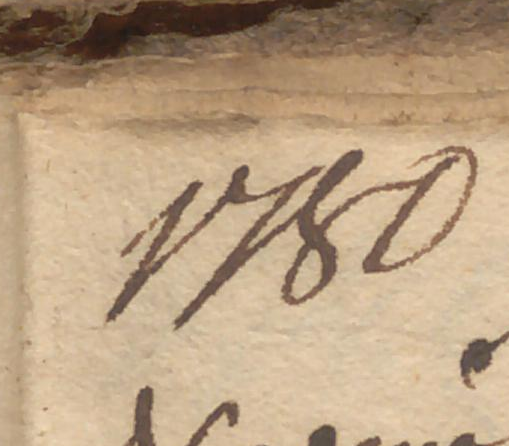1780
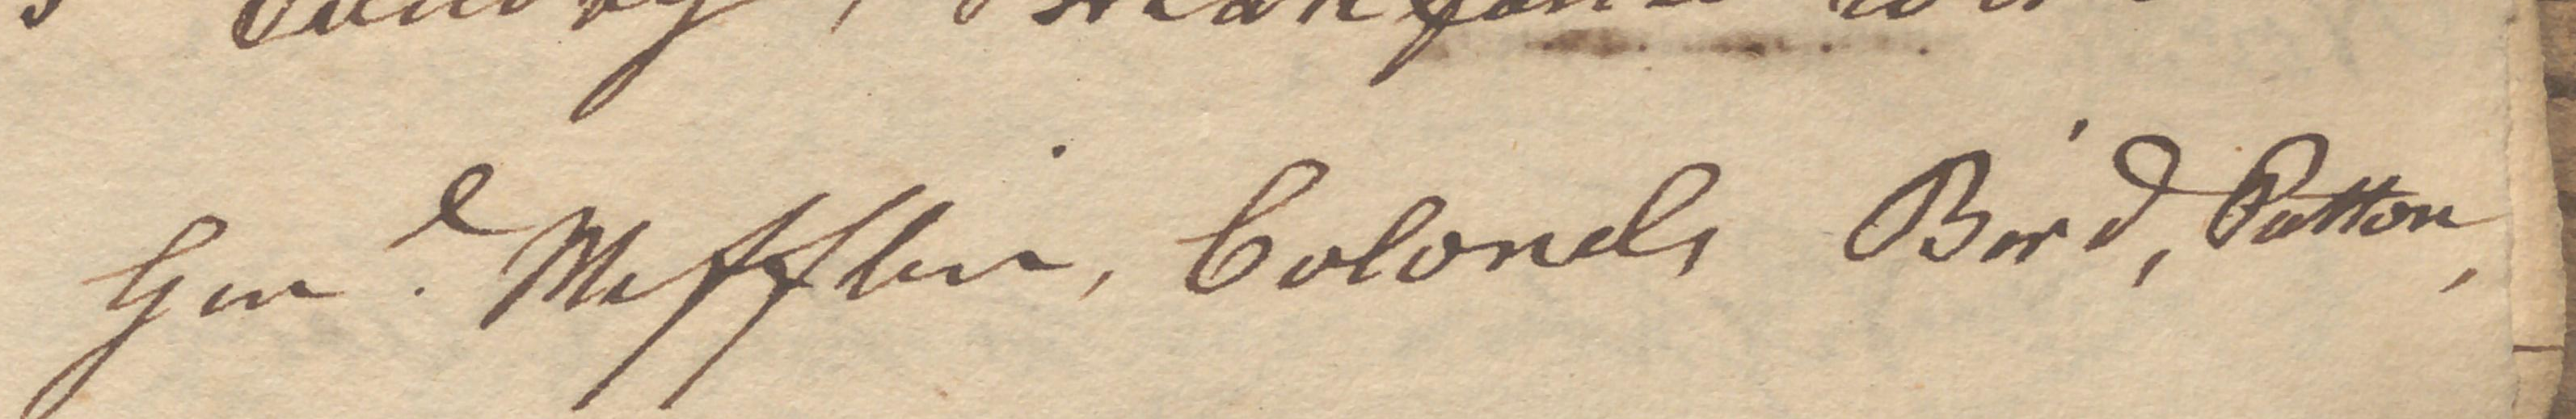Gen^l. Mifflin, Colonels Bird Patton
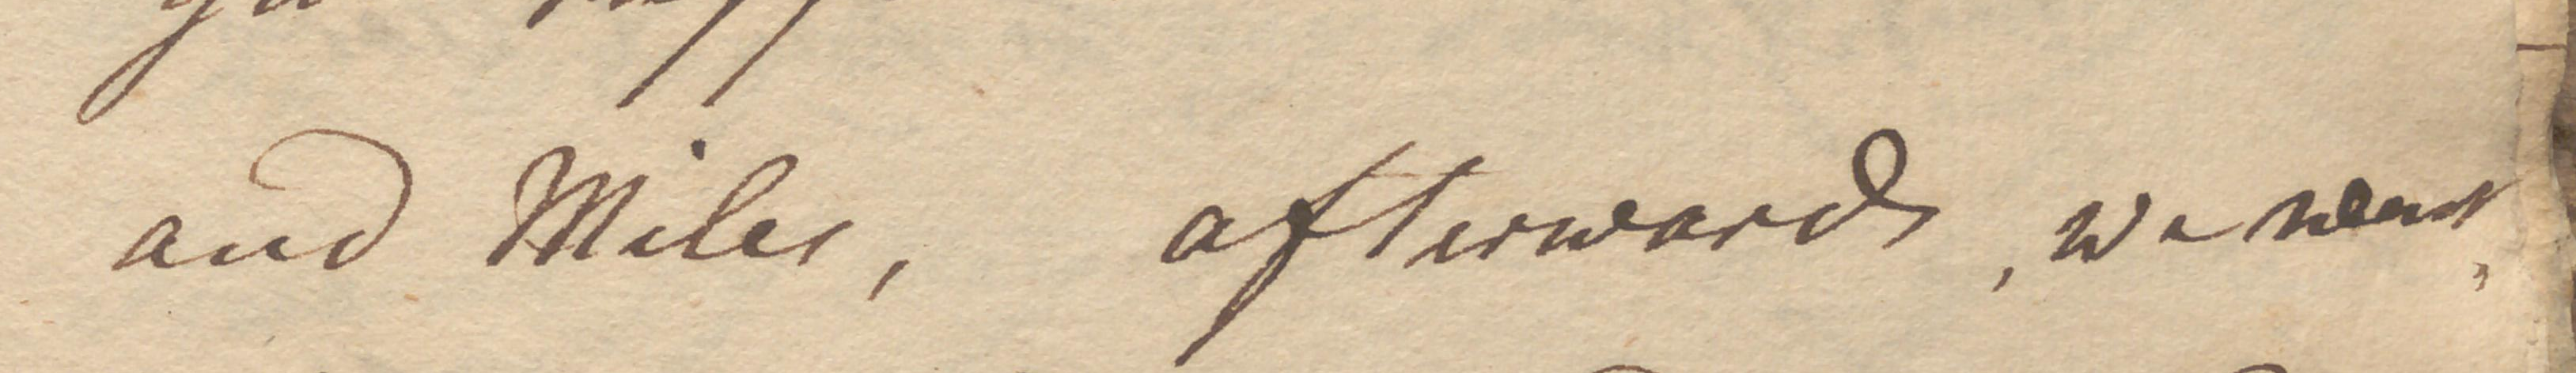aned Miles afterwards we went
